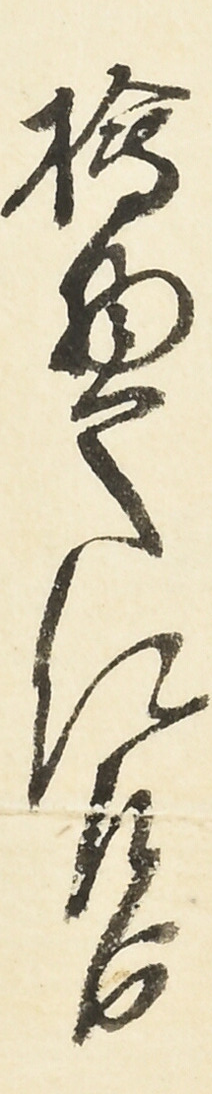檜物や仁左衛門
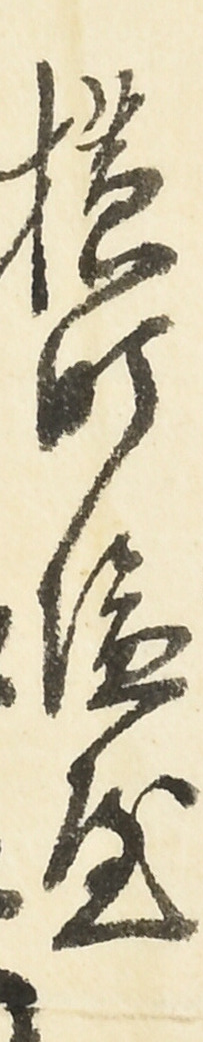横町塩屋
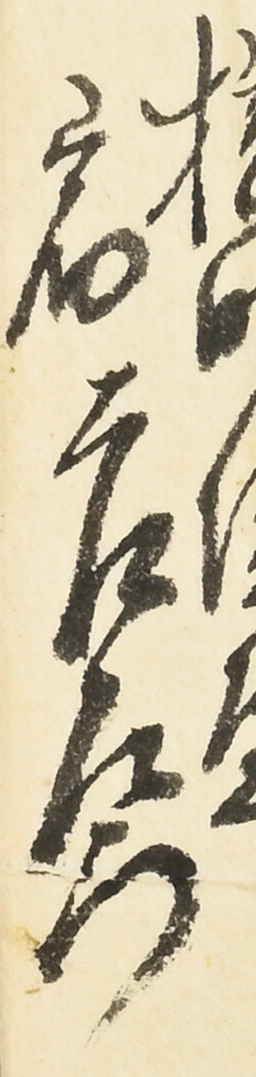宿善左衛門
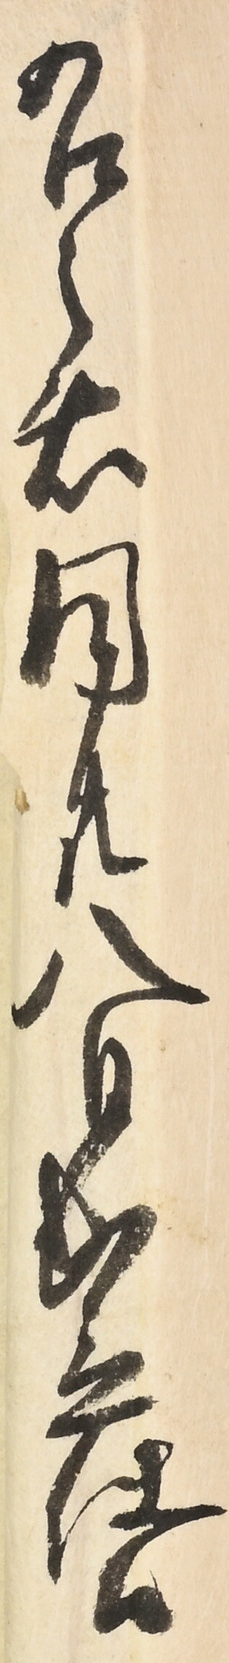右之者同廿八日出立仕候
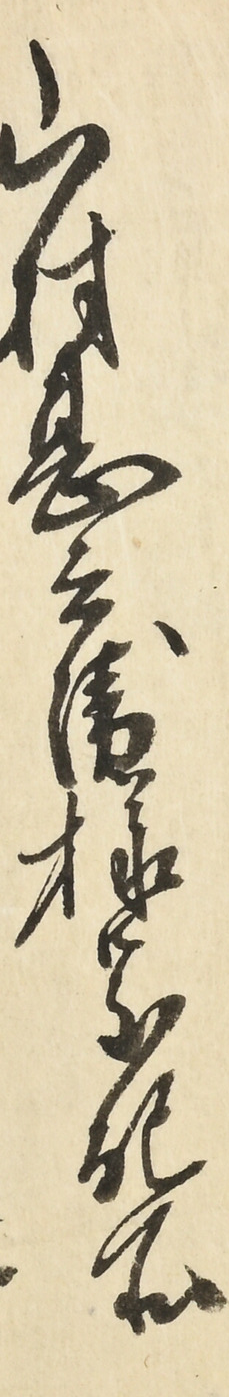山村甚兵衛様御支配所
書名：町中旅人泊控帳
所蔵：伊那市立高遠町図書館・合同会社AMANE
